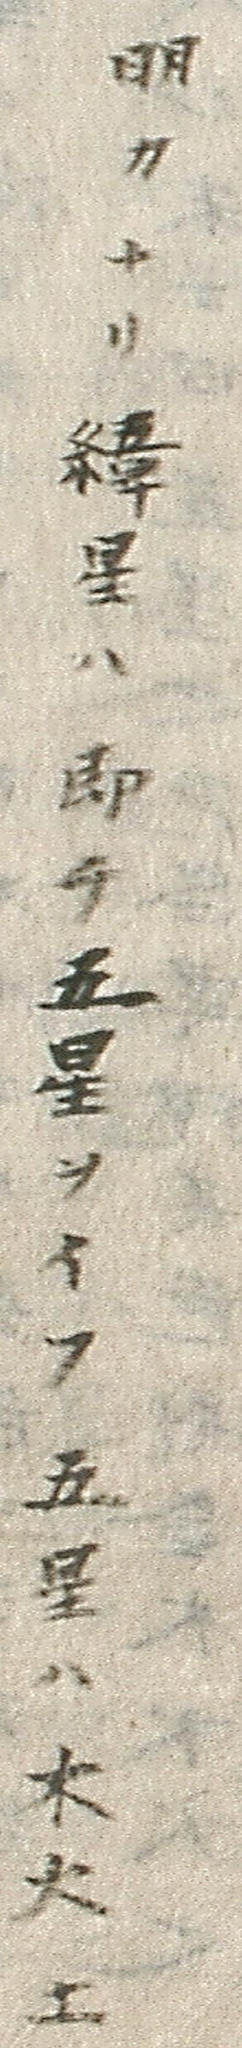明カナリ緯星ハ即チ五星ヲイフ五星ハ木火土
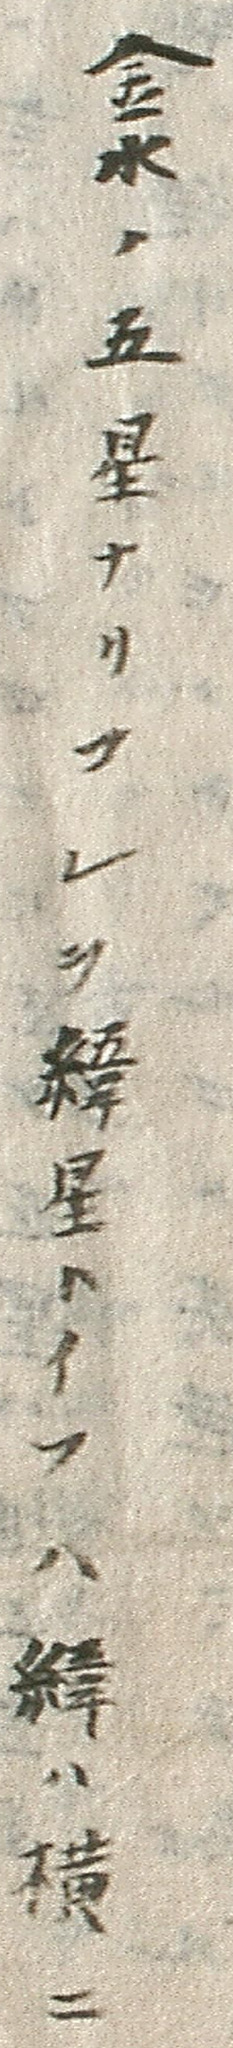金水ノ五星ナリコレヲ緯星トイフハ緯ハ横ニ
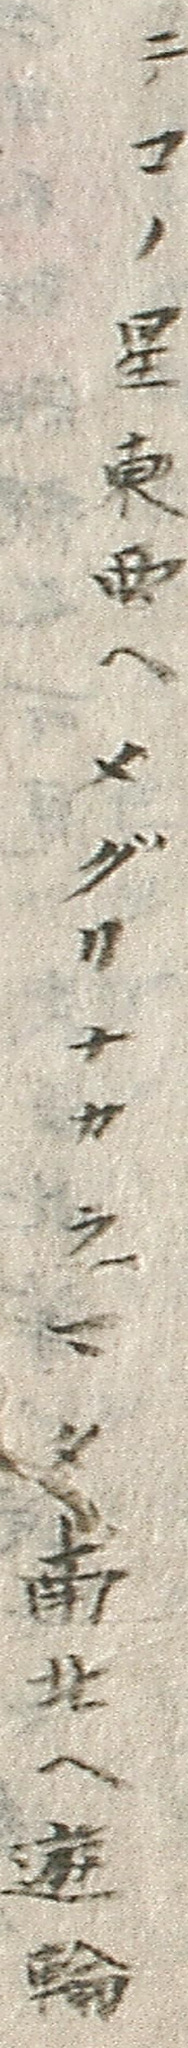テコノ星東西ヘメグリナカラマタ南北ヘ遊輪
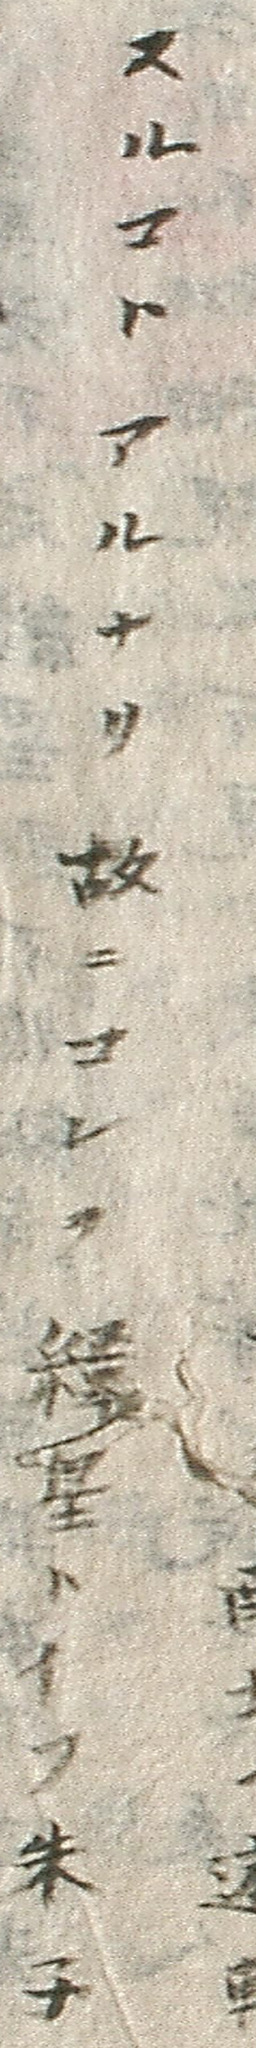スルコトアルナリ故ニコレヲ緯星トイフ朱子
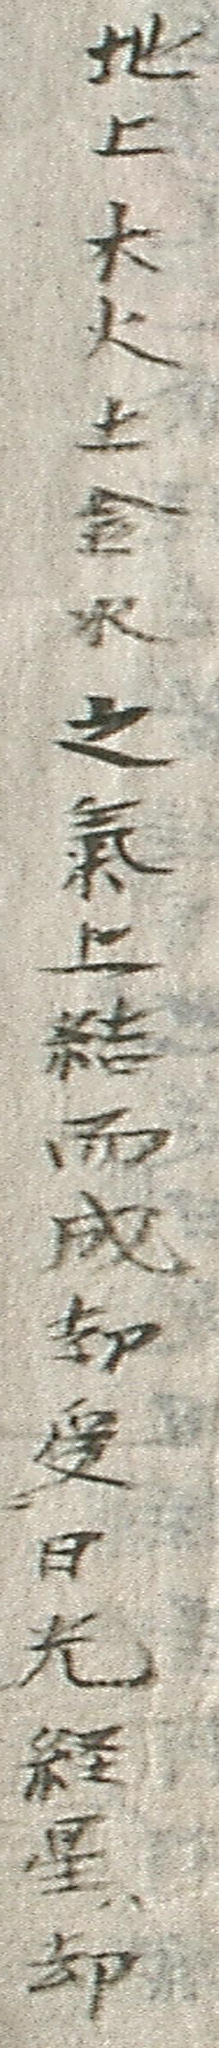地上木火土金水之気上結而成却受ニ日光経星却

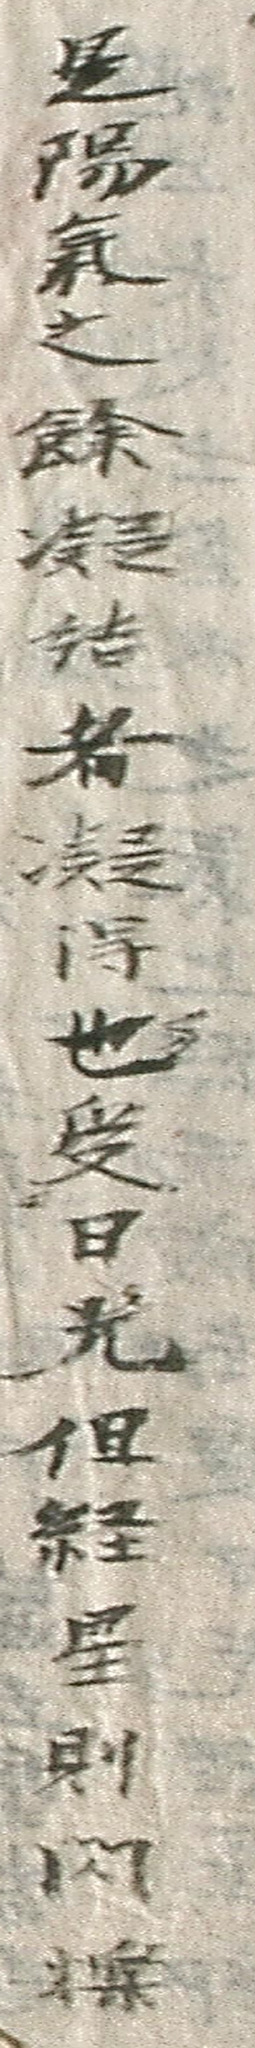是陽気之餘凝結者凝得也受ニ日光但経星則閃爍
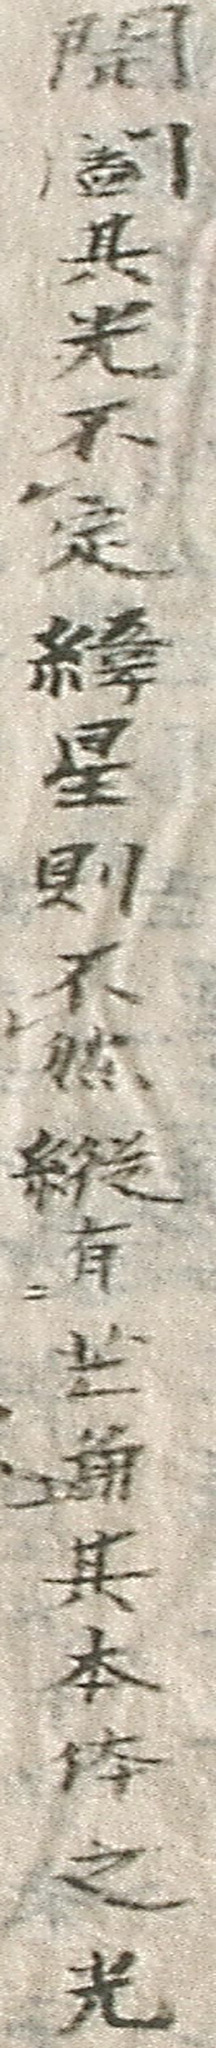開闔其光不定緯星則不然縦有ニ芒角其本体之光
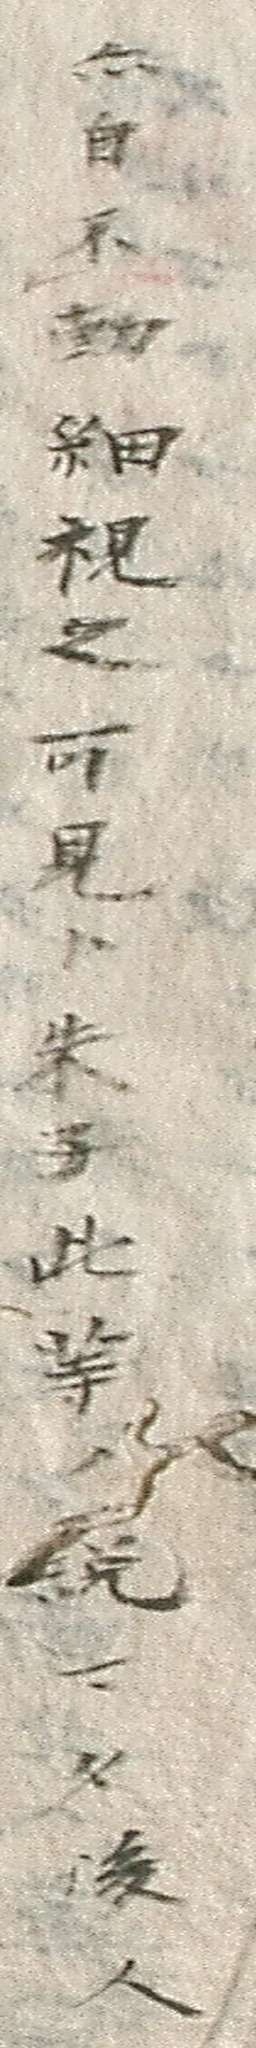亦自不動細視之可見ト朱子此等ノ説マタ後人
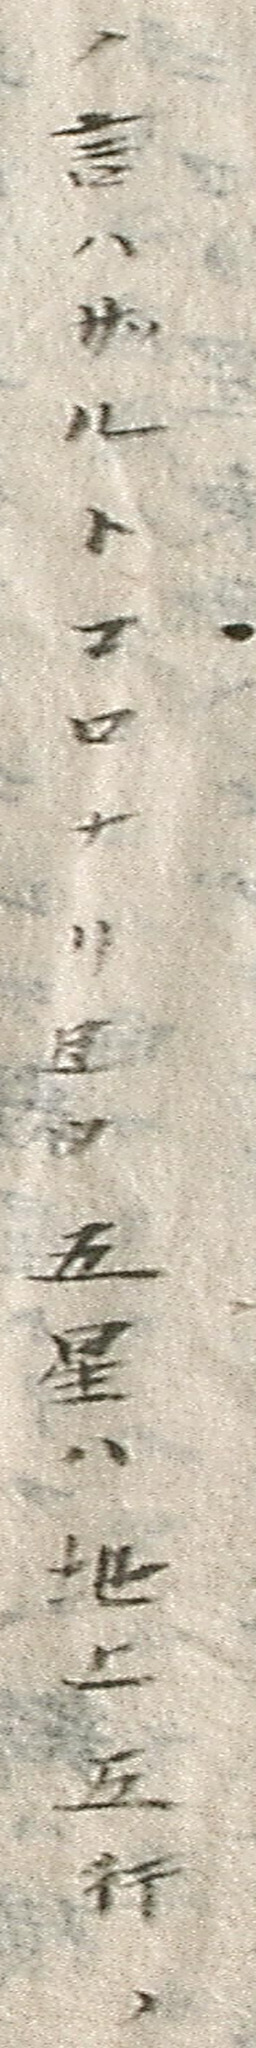ノ言ハザルトコロナリ且ツ五星ハ地上五行ノ
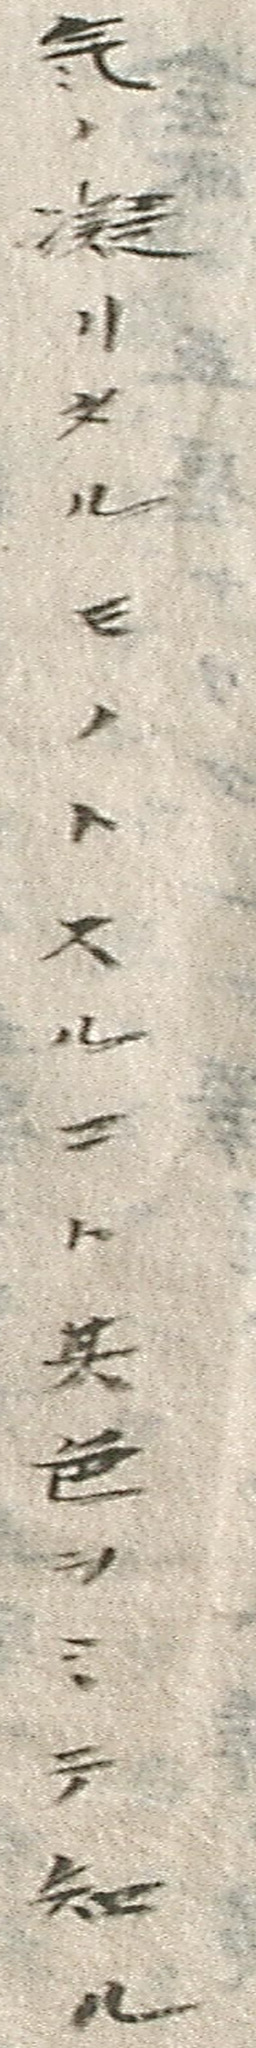気ノ凝リタルモノトスルコト其色ヲミテ知ル
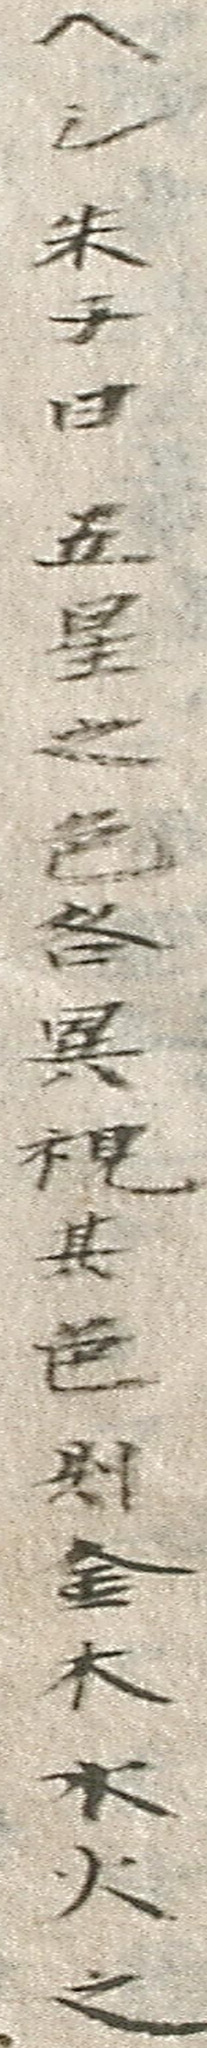ヘシ朱子曰五星之色各異視其色則金木水火之
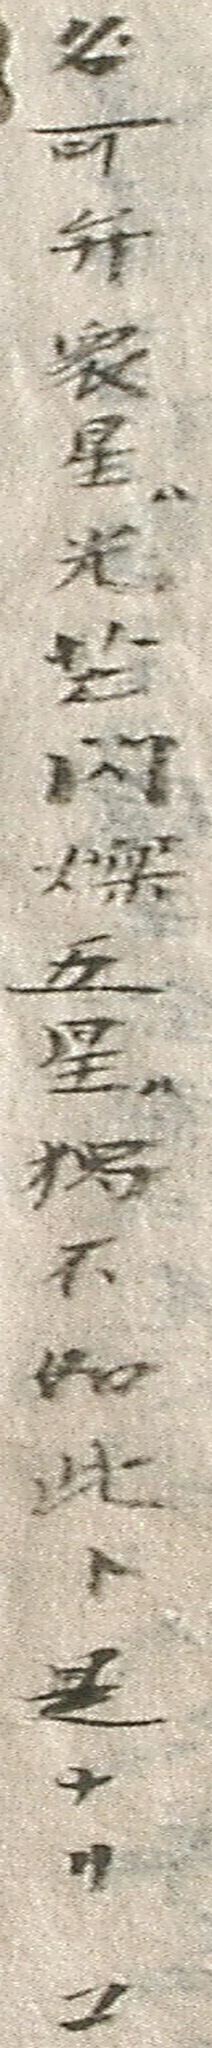名可弁衆星光芒閃爍五星獨不如此ト是ナリコ
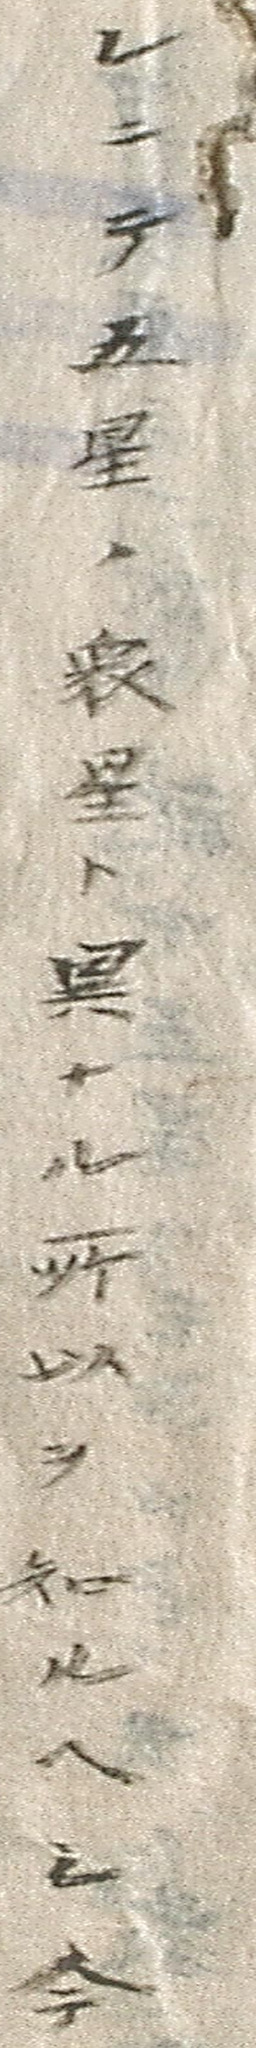レニテ五星ノ衆星ト異ナル所以ヲ知ルヘシ今
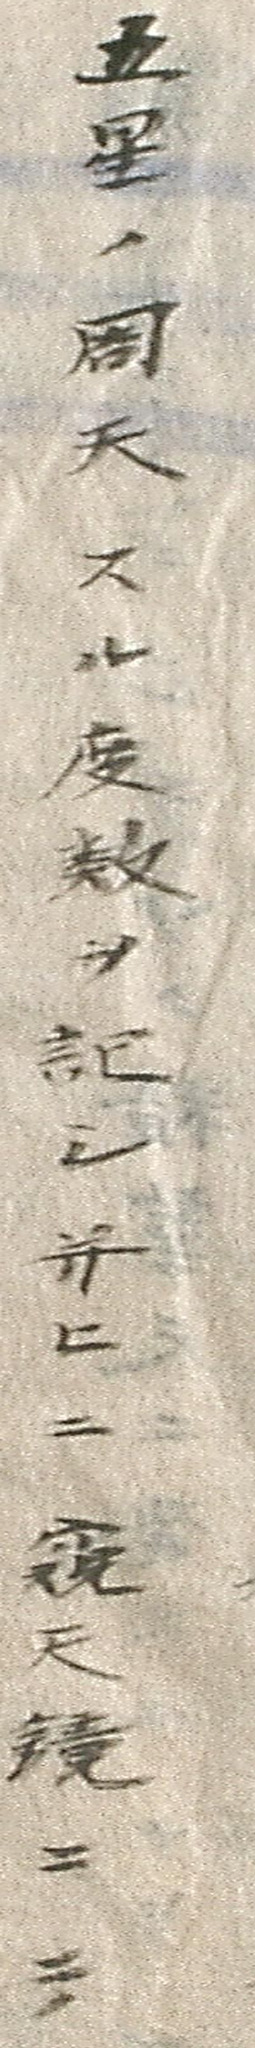五星ノ周天スル度数ヲ記シ幷ヒニ窺天鏡ニテ
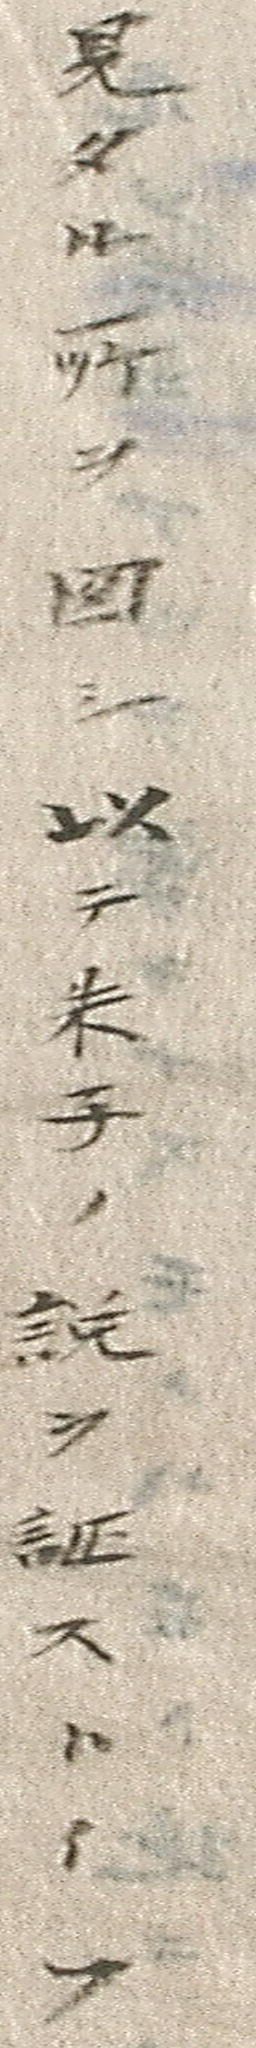見タル所ヲ図シ以テ朱子ノ説を証ストイフ
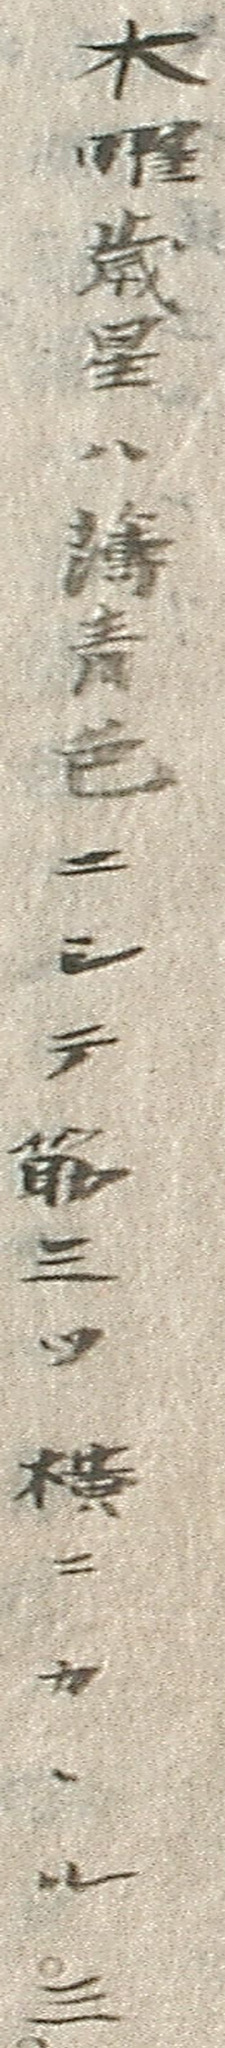木曜歳星ハ薄青色ニシテ筋三ツ横ニカヽル三
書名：天學便蒙図説
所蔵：東京大学地震研究所図書室 Earthquake Research Institute Library, The University of Tokyo, JAPAN
